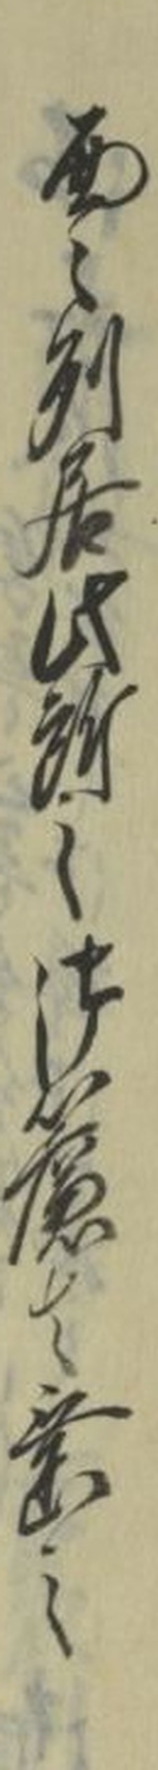面々列居此所之御簾は垂之
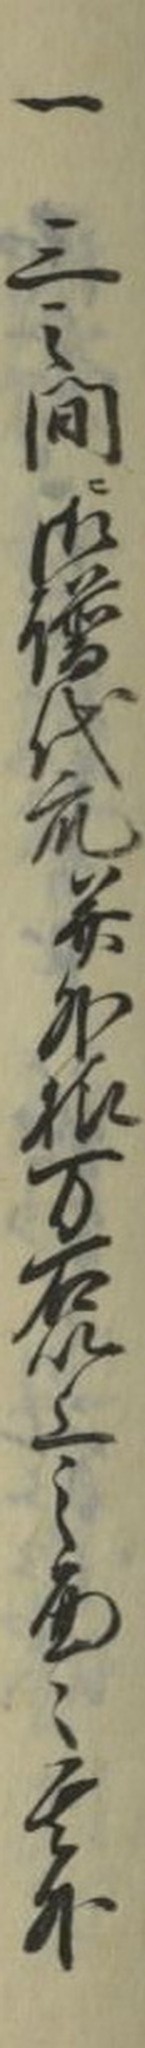一三之間に御譜代衆并外様万石以上之面々其外
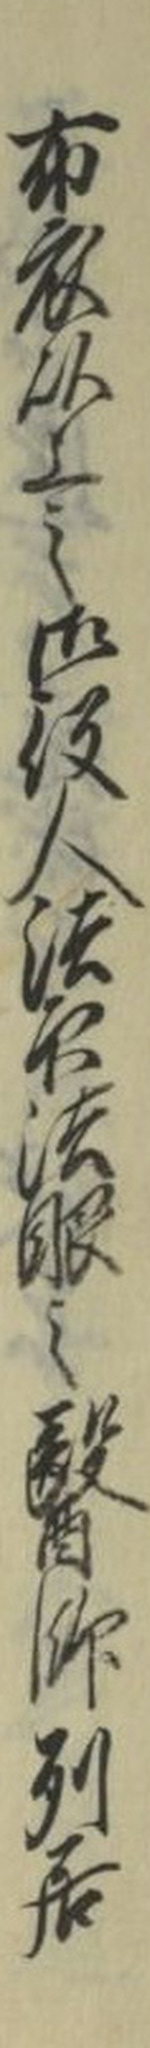布衣以上之御役人法印法眼之医師列居
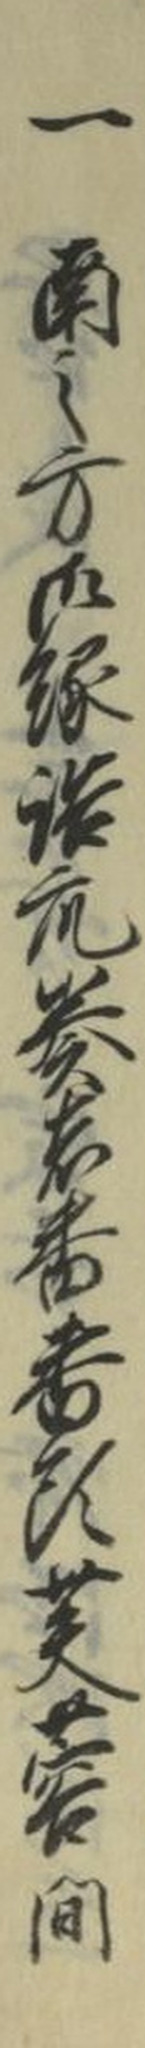一南之方御縁詰衆奏者番番頭芙蓉間
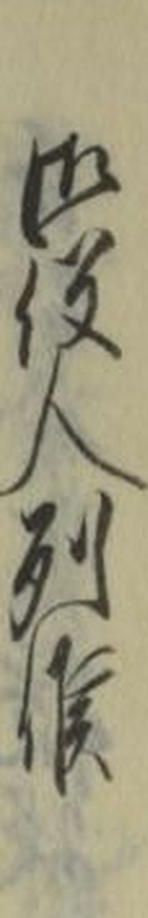御役人列候
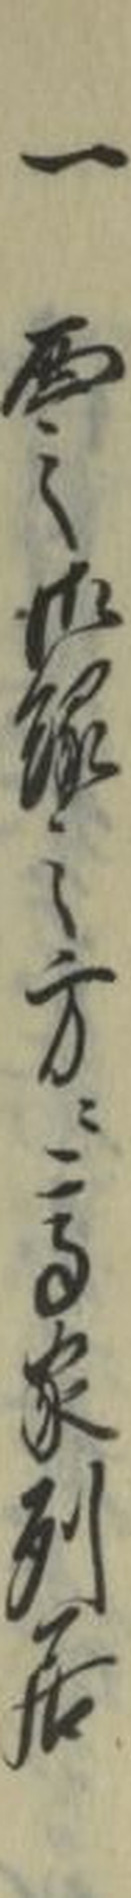一西之御縁之方に高家列居
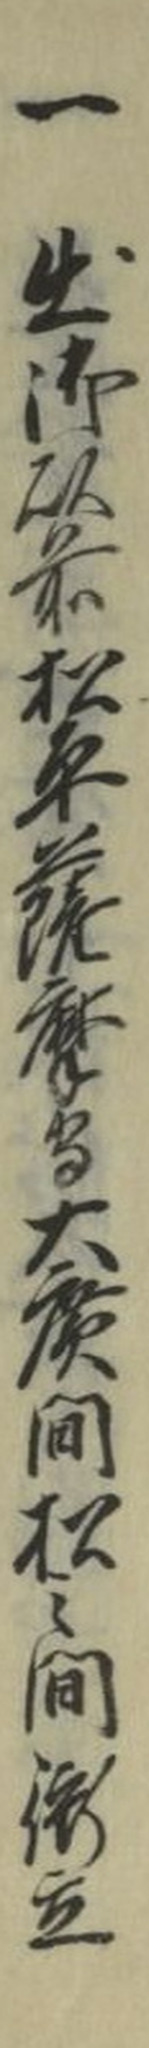一出御以前松平薩摩守大広間松之間衝立
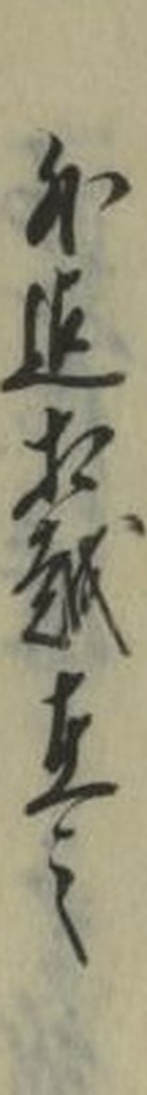外迄相越在之

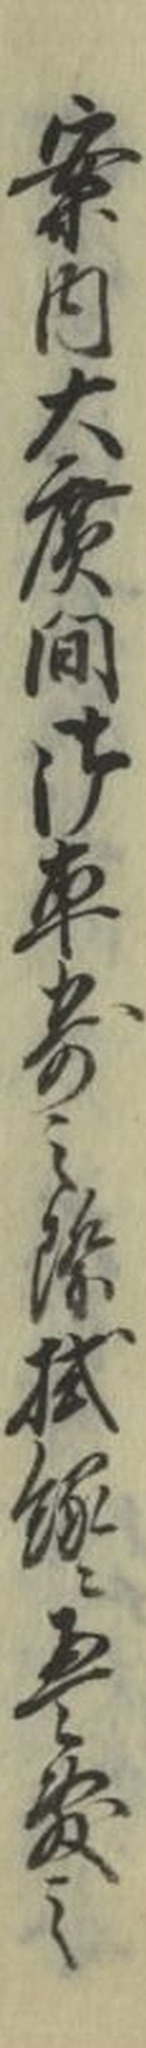案内大広間御車寄之際拭縁に畳敷之
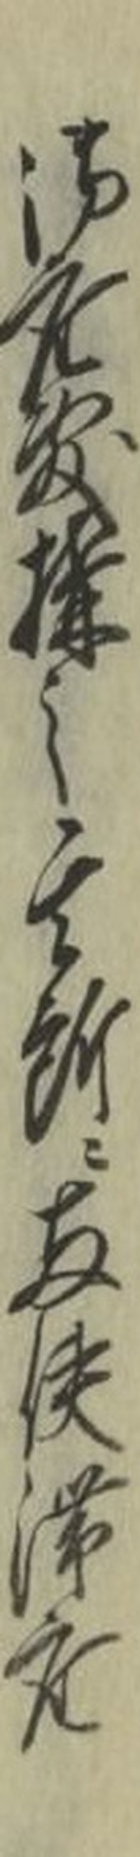御座敷構之其所に両使滞座
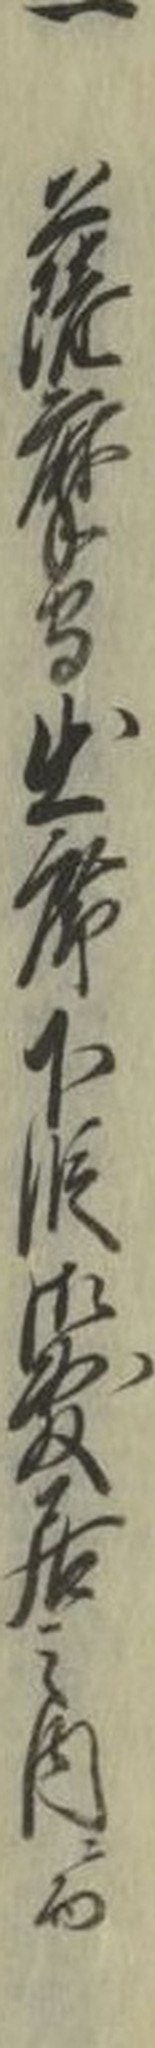一薩摩守出席下段御敷居之内に而
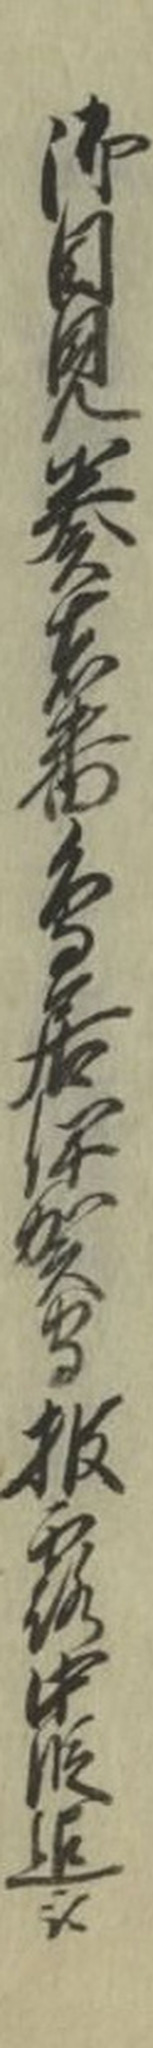御目見奏者番鳥居伊賀守披露中段迄被
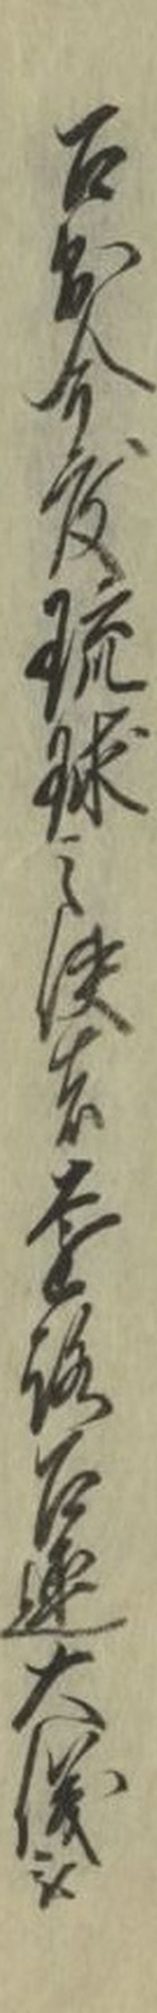召出今度琉球之使者遠路召連大儀被
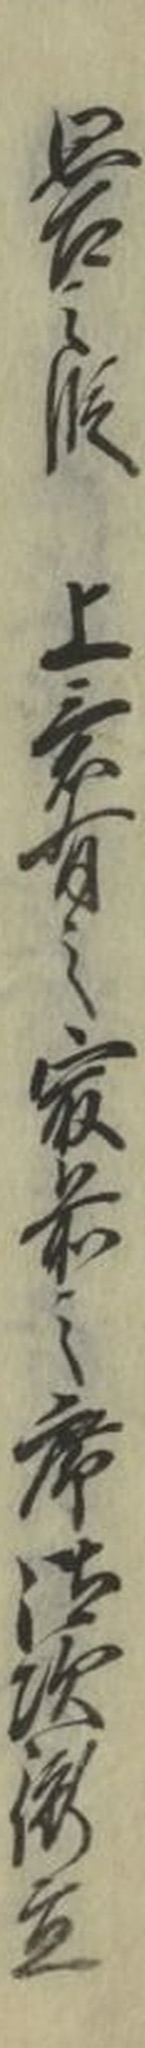思召之段上意有之最前之席御次衝立
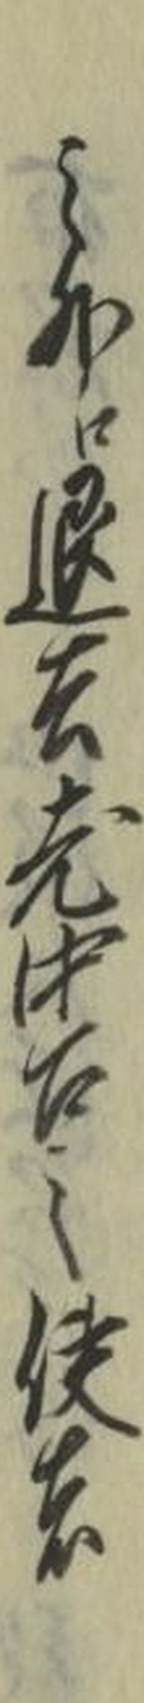之外え退去老中召之使者
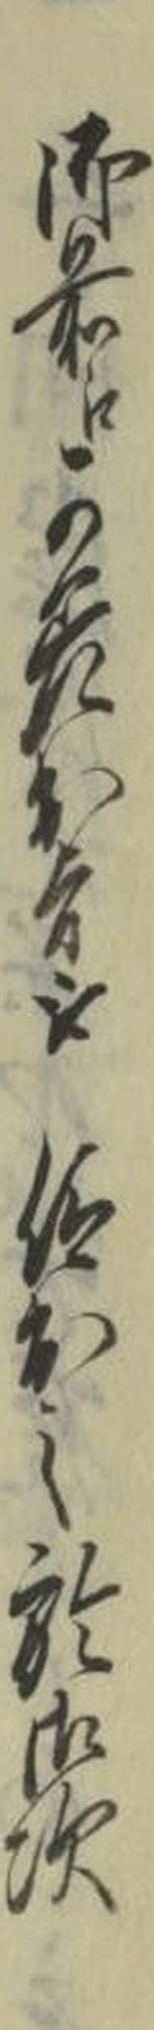御前え可差出旨被仰出之於御次
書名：琉球人参府記
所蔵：University of the Ryukyus Library
